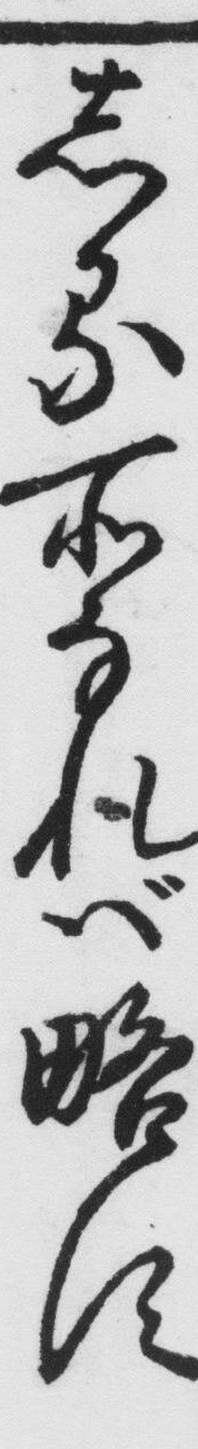しる所なれば略す

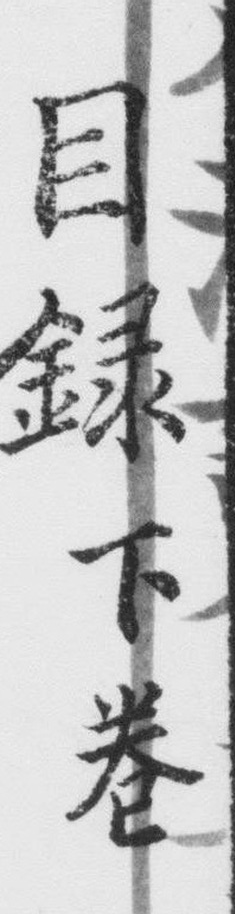目録下巻
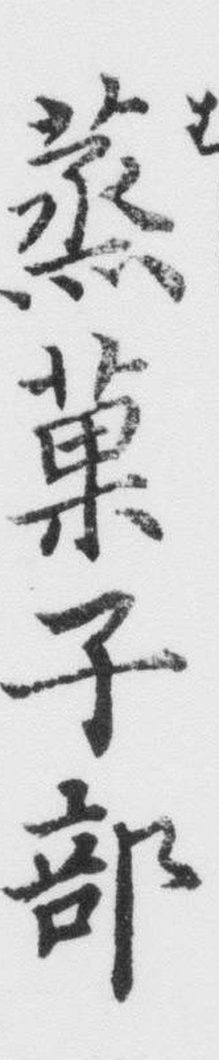蒸菓子部

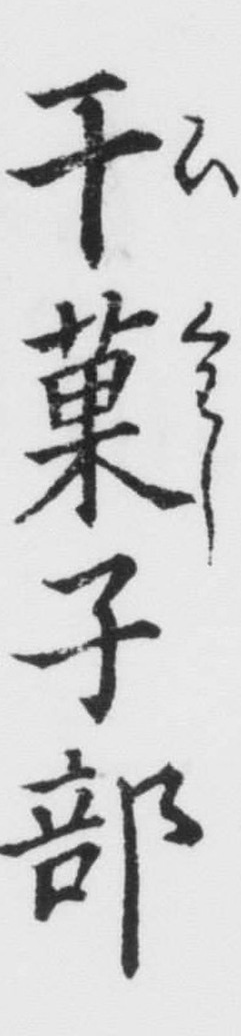干菓子部

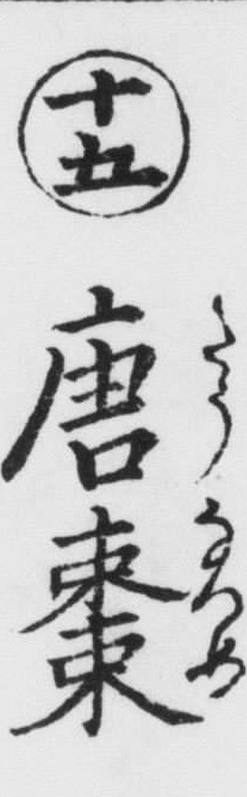(十五)唐棗
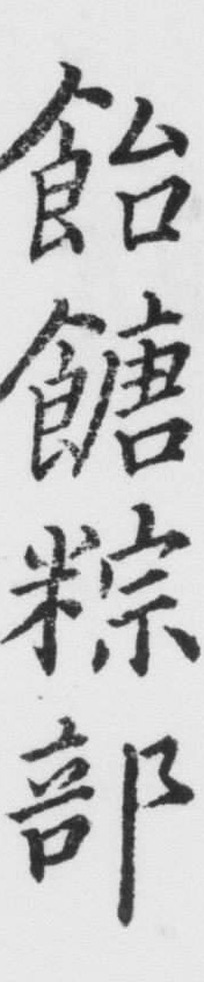飴餹粽部
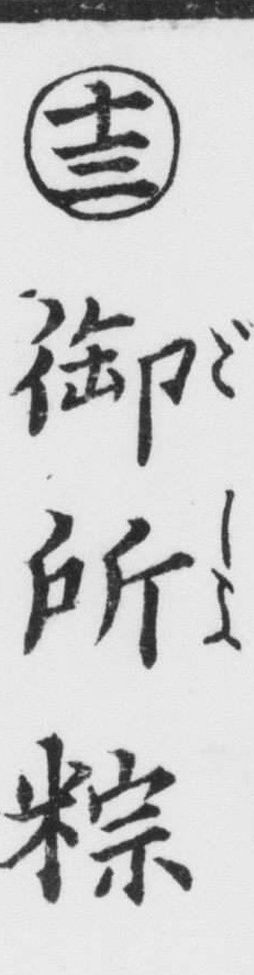(十三)御所粽

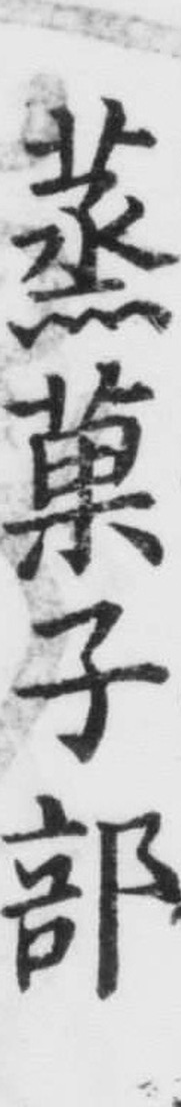蒸菓子部
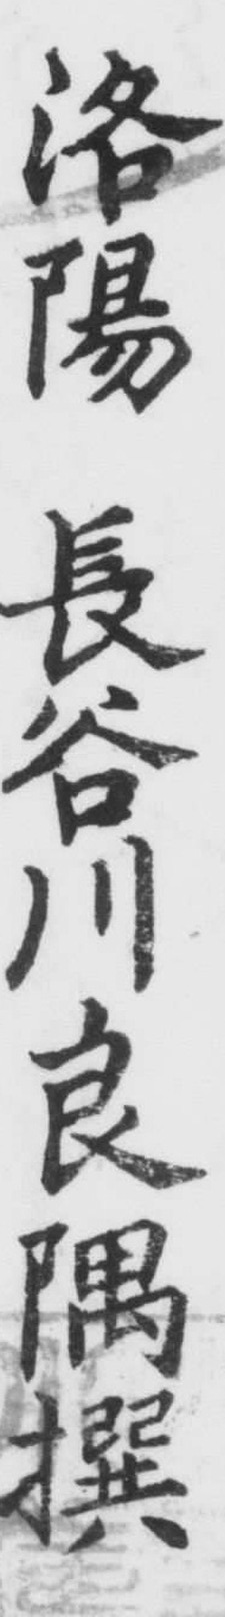洛陽長谷川良隅撰
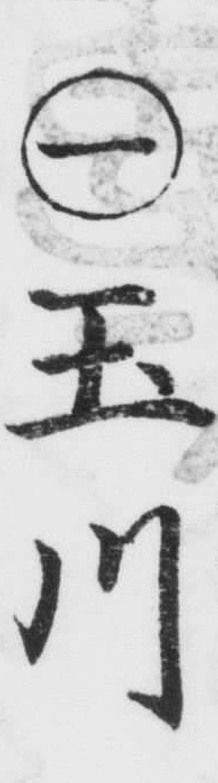(一)玉川
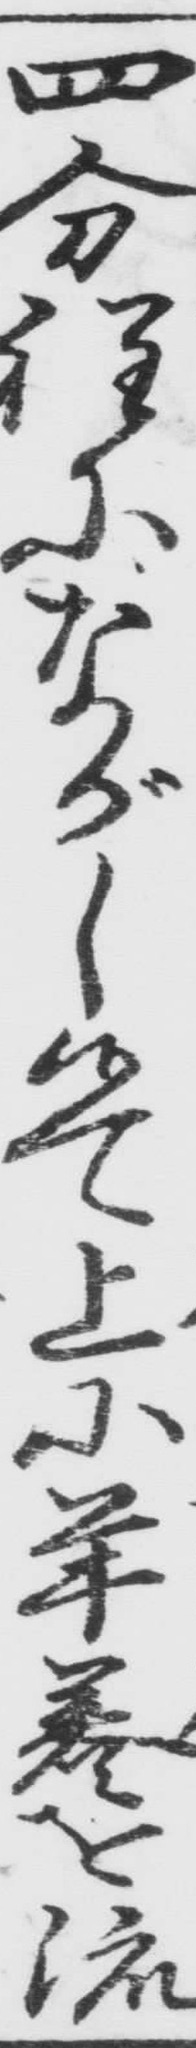四分程にながし候て上に羊羹を流
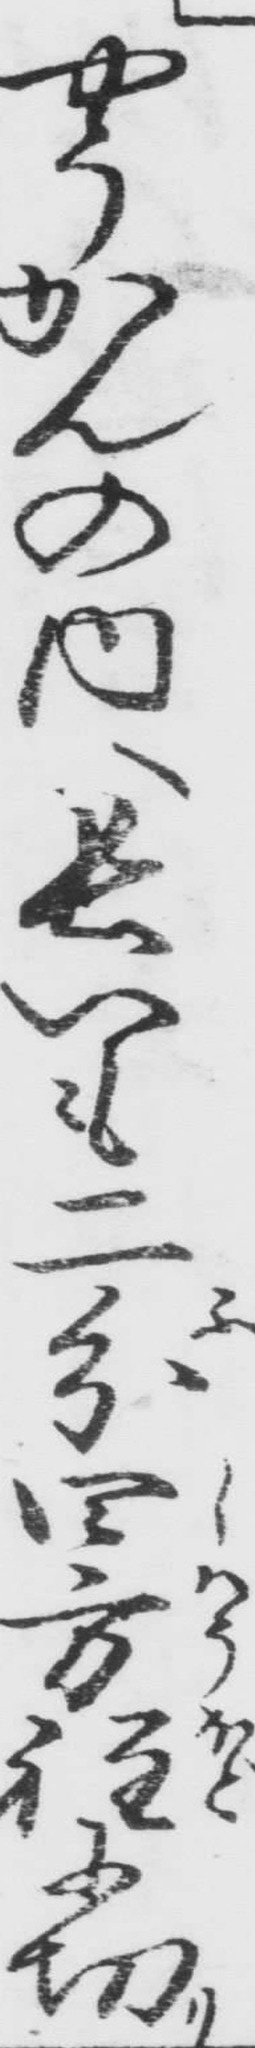やうかんの内へ長いも二分四方程に切り
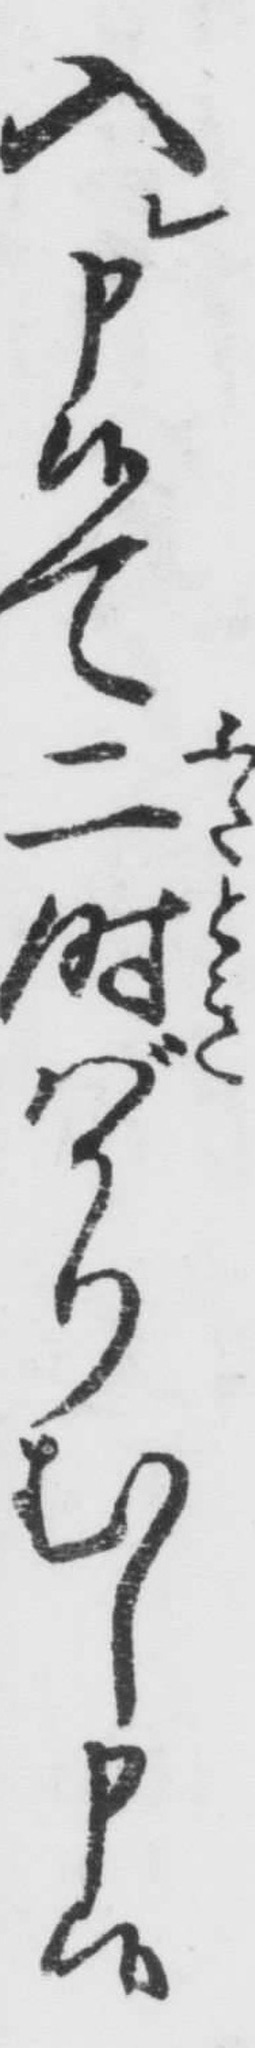入れ申候て二時ばかりむし申候

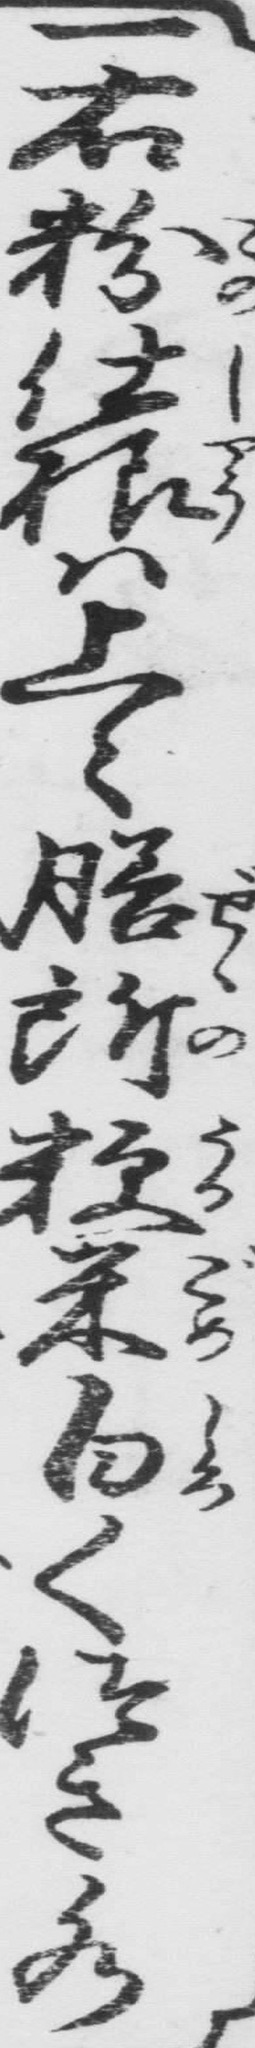一右粉仕様は上々膳所粳米白くつき水
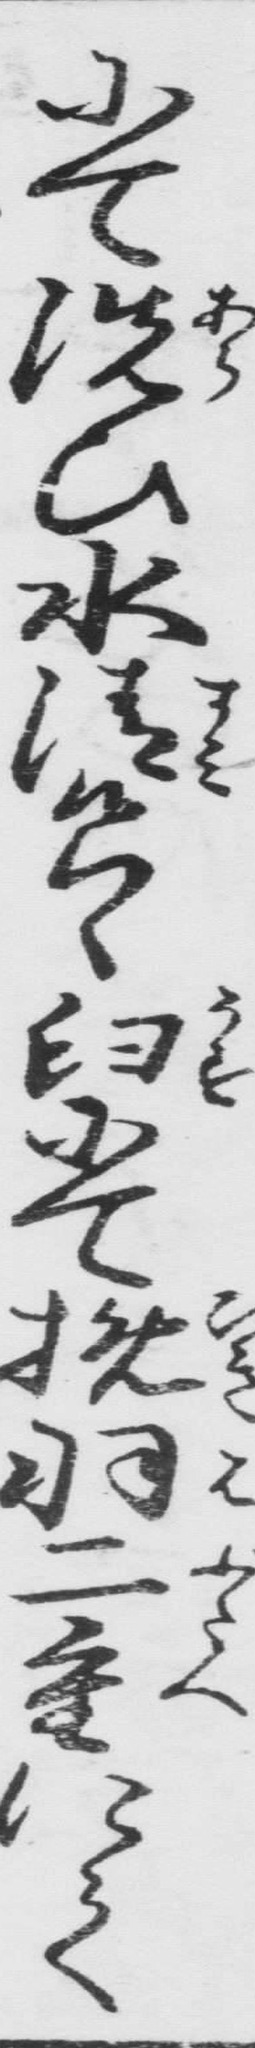にて洗ひ水清候はゝ臼にて挽羽二重にて
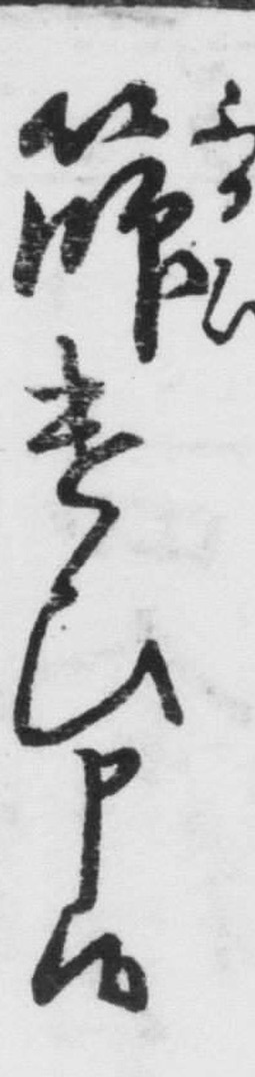篩遣ひ申候
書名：御前菓子図式
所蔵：大阪府立大学学術情報センター 国文学研究資料館
